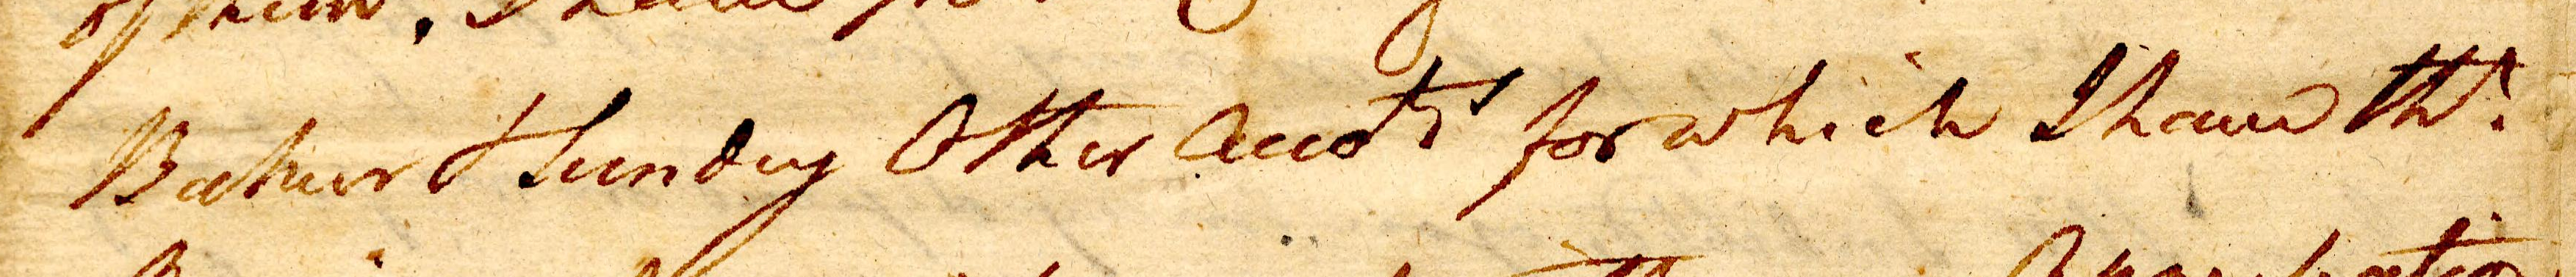Baker & Sundry Other acco^ts for which I have th^r.
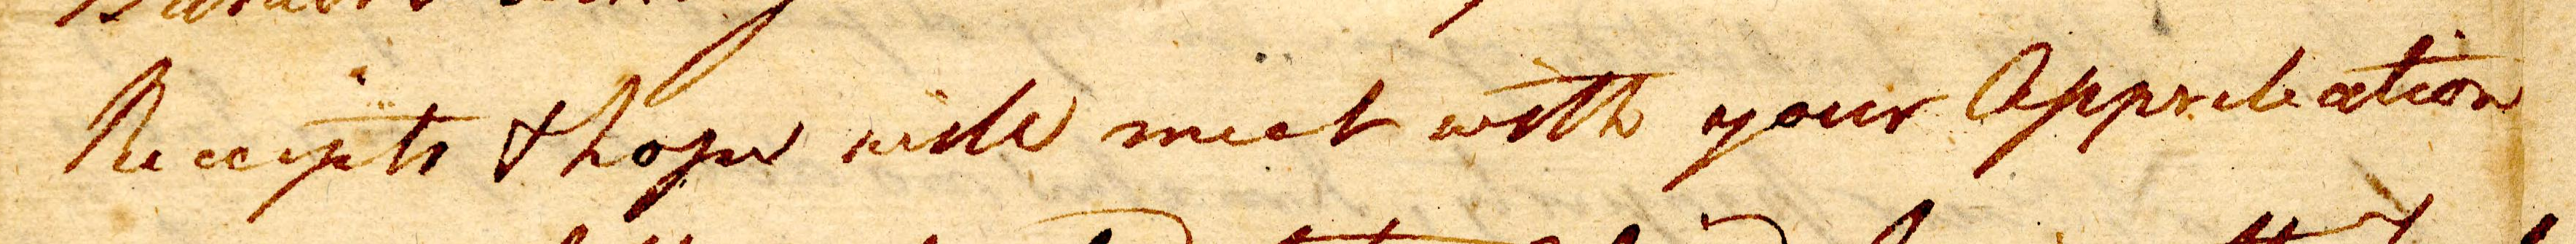Receipts & hope will meet with your appreciation
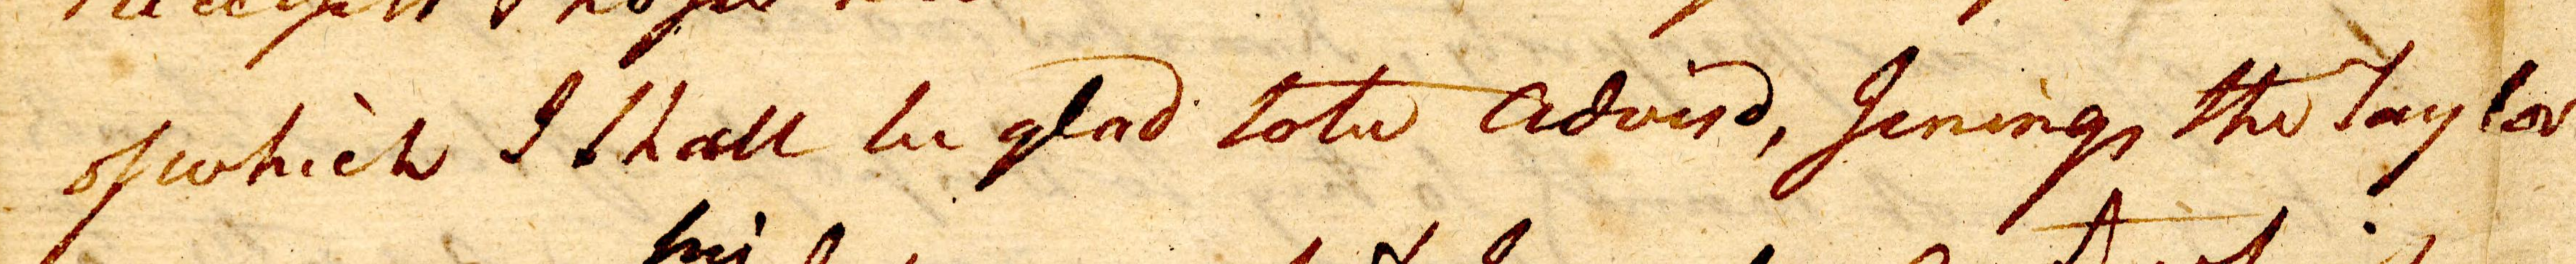of which I shall be glad to be advisd, Jening, the Taylor
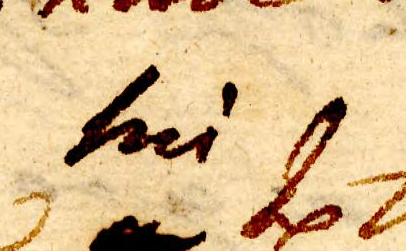his
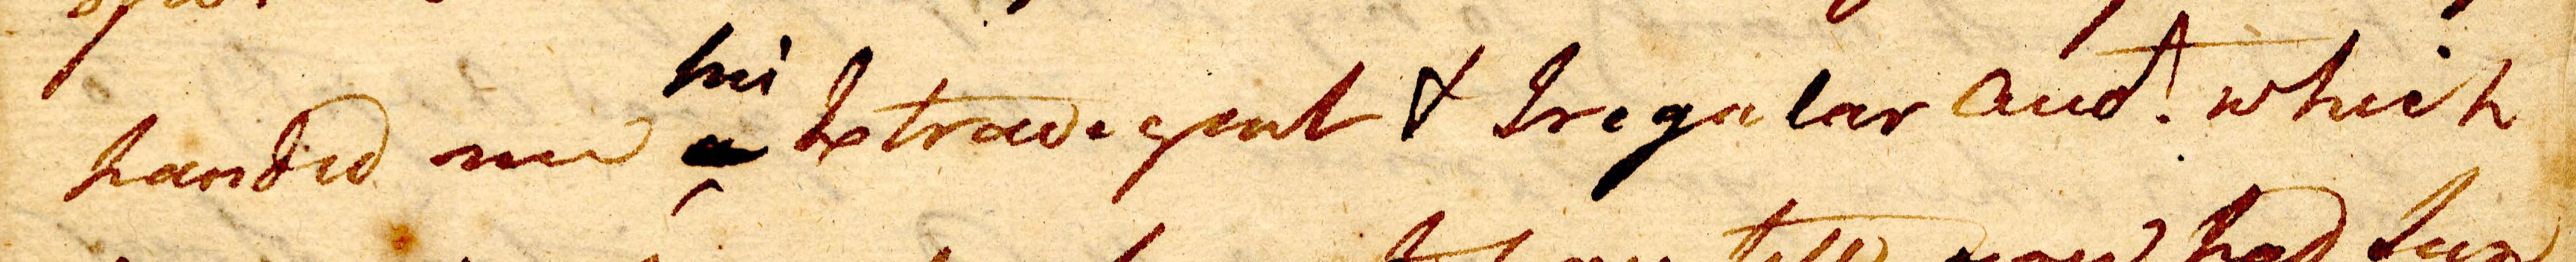handed me [] ^Extravagant & Irregular acco^t. which
